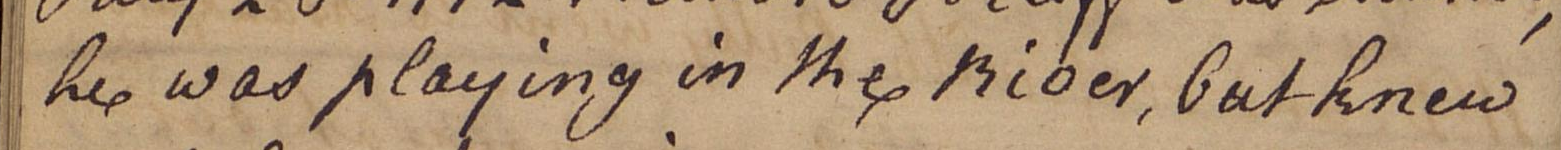he was playing in the River, but knew
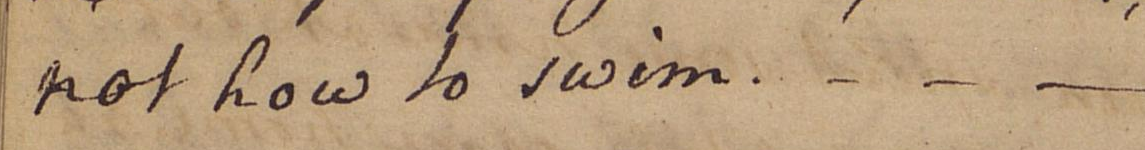not how to swim.---
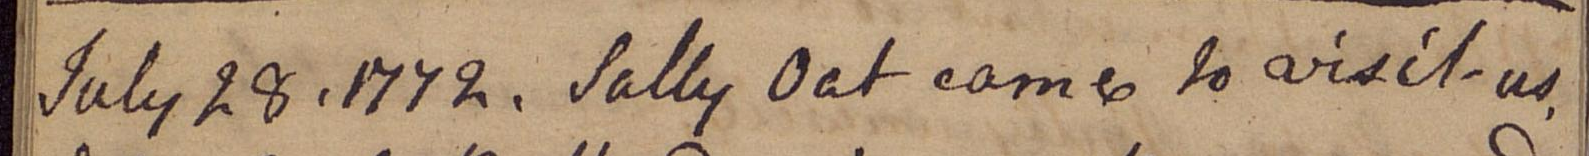July 28, 1772. Sally Oat came to visit us
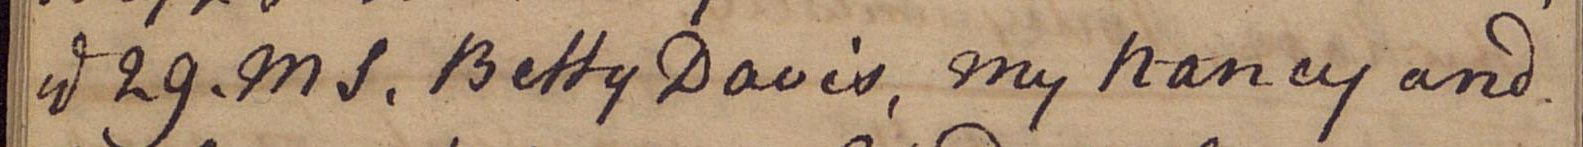y^e 29. MS. Betty Davis, my Nancy and
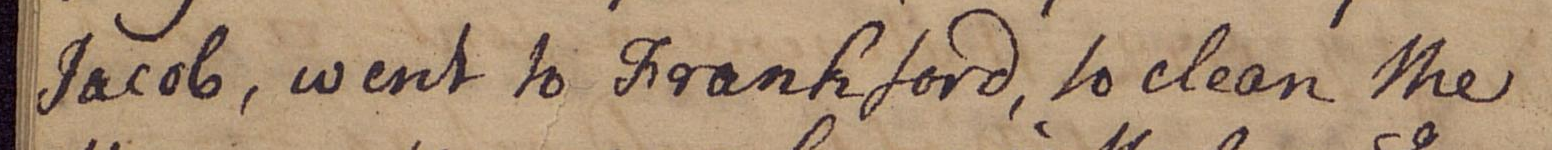Jacob, went to Frankford, to clean the
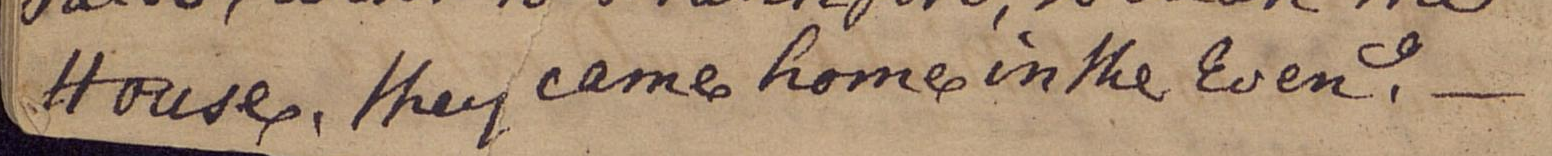House, they came home in the Even^g.-
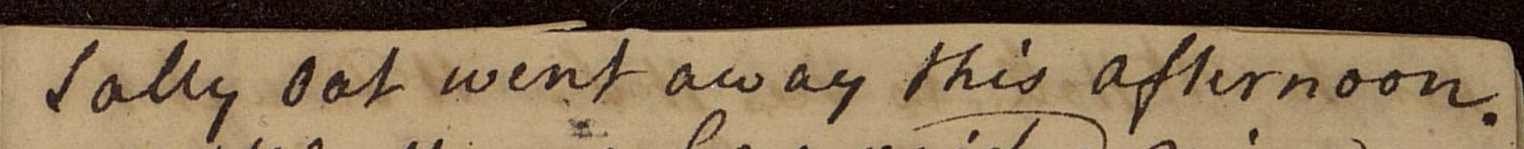Sally Oat went away this afternoon.
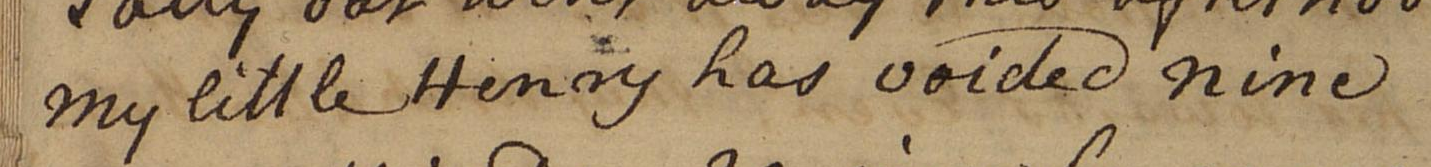my little Henry has voided nine
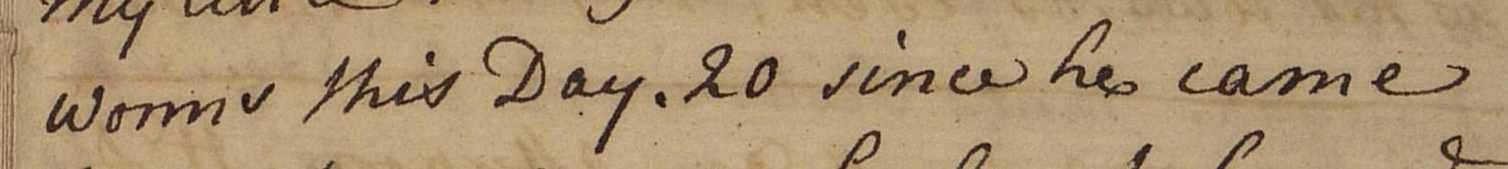worms this Day, 20 since he came
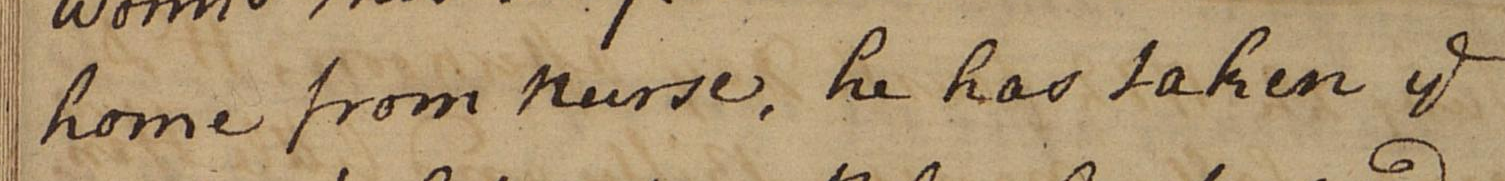home from Nurse, he has taken y^e
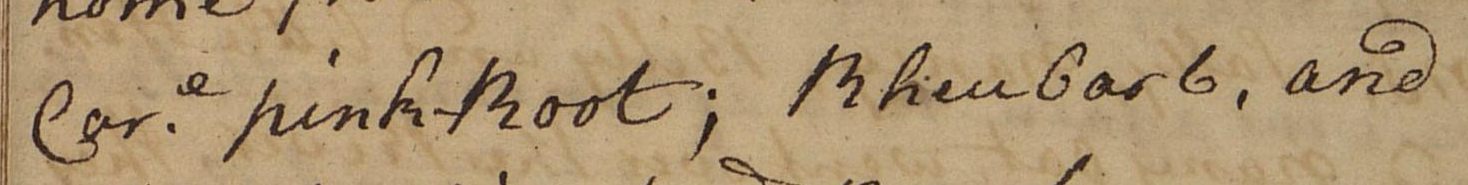Car^l. pink Root; Rheubarb, and
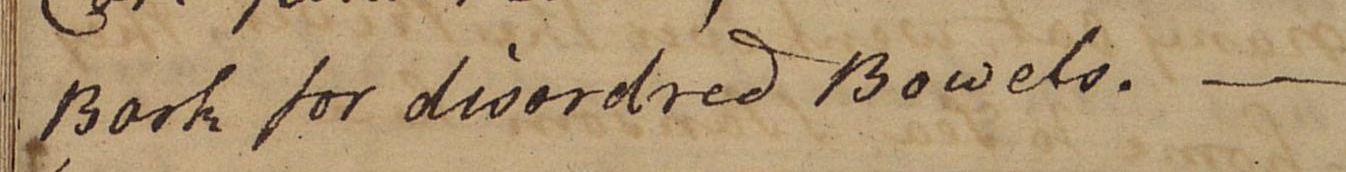Bark for disordred Bowels.-
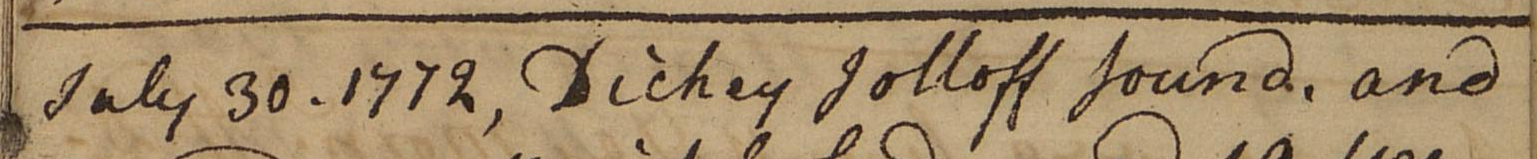July 30. 1772, Dichey Jolloff found, and
